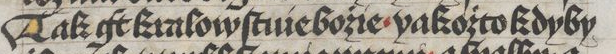Tak ḡt kralowſtuíe bożíe.yakożto kdyby
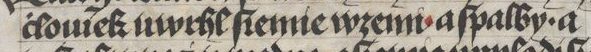ċlowiek urhl ſieme wzemí.a ſpalby.a
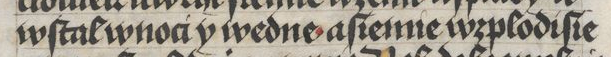wſtal vnoci y wedne.a ſietmie wzplodí ſie¬
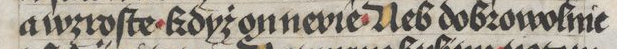a wzroſte. kdyż on nevíe Neb dobrowolnie
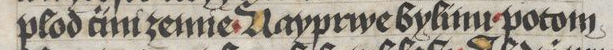plod ċíni zemie.Nayprwe bylinu.potom
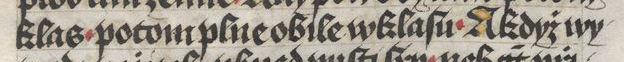klas.potom plne obile wklaſu.Akdyž wy¬
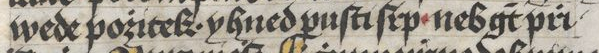wede pożitek.y hned puſti ſrp.neb ḡt pṙi¬
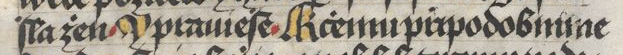ẛla žen.Y prauíeẛe.K ċemu pṙipodobnime
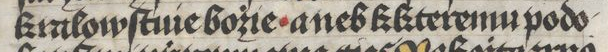kralowſuíe bożíe.aneb kteremu podo¬
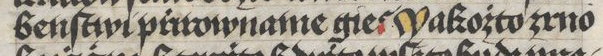benſtwi pṙirownanie gie?Yakożto zrno¬
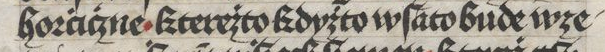horċicżne.kterežto kdyżto wſato bude wze¬
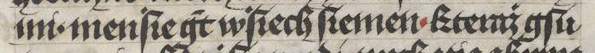mi.menẛie ḡt wẛíech ſiemet. kteríž gſu
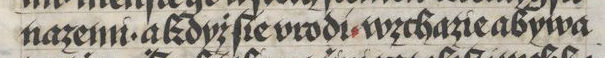nezeṅí.a kdyż ſie vrodí.wzcházíe abywa
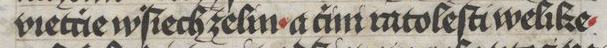vietċie wẛiech zelim.a čini ratoleſti welike.
